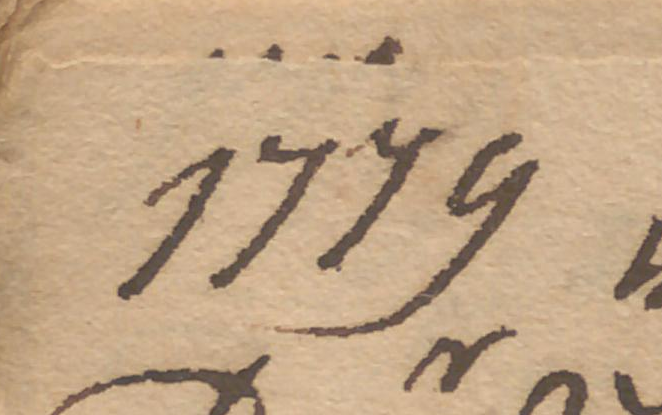1779
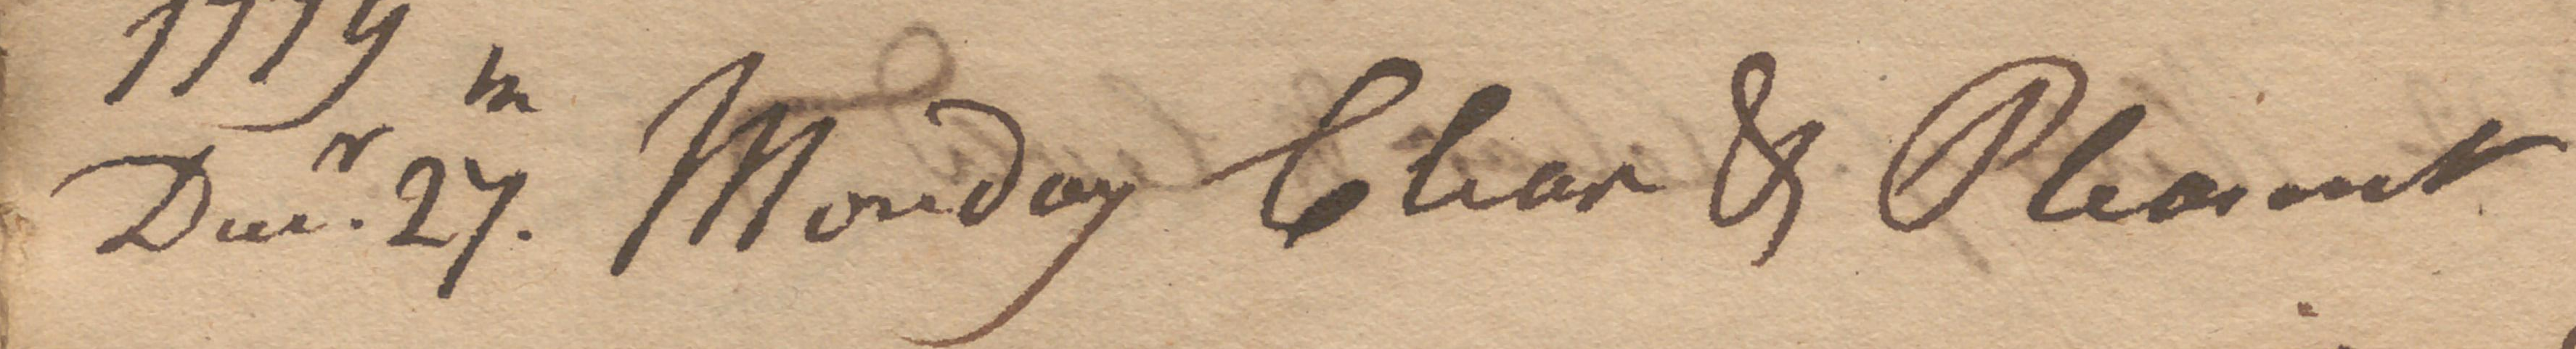Dec^r. 27^th. Monday Clear & Pleasent
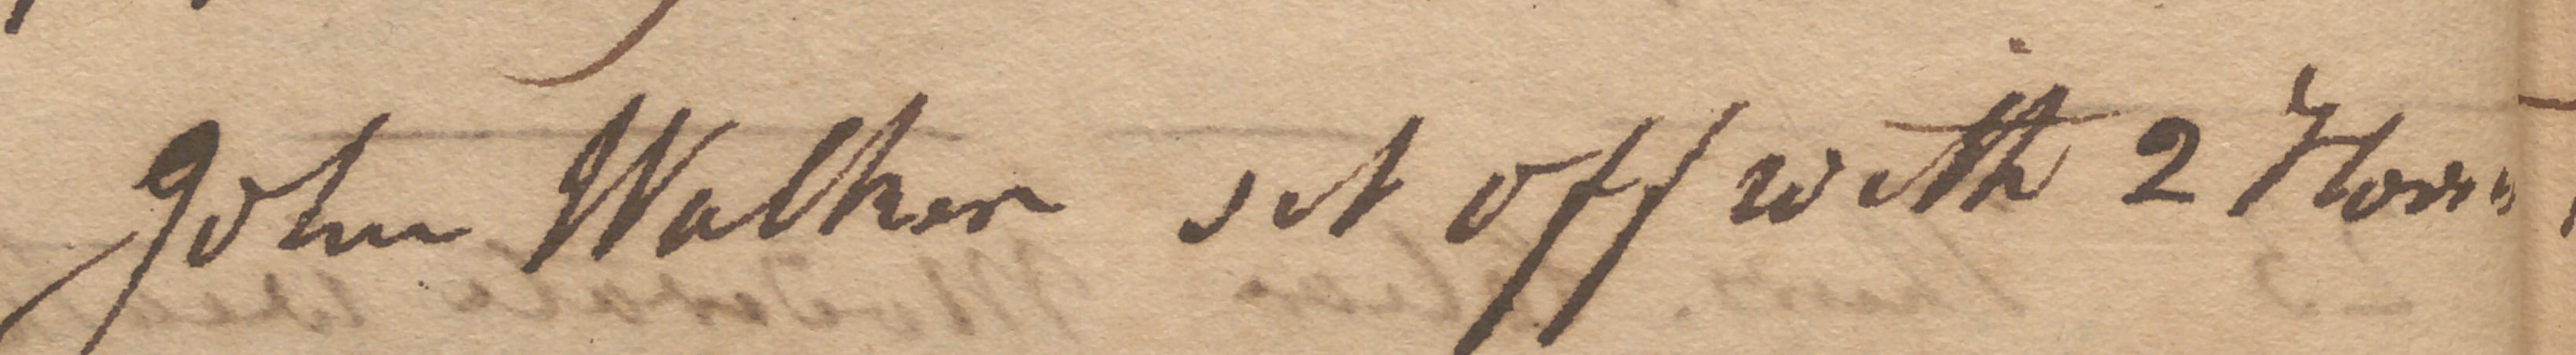John Walker set off with 2 Horses
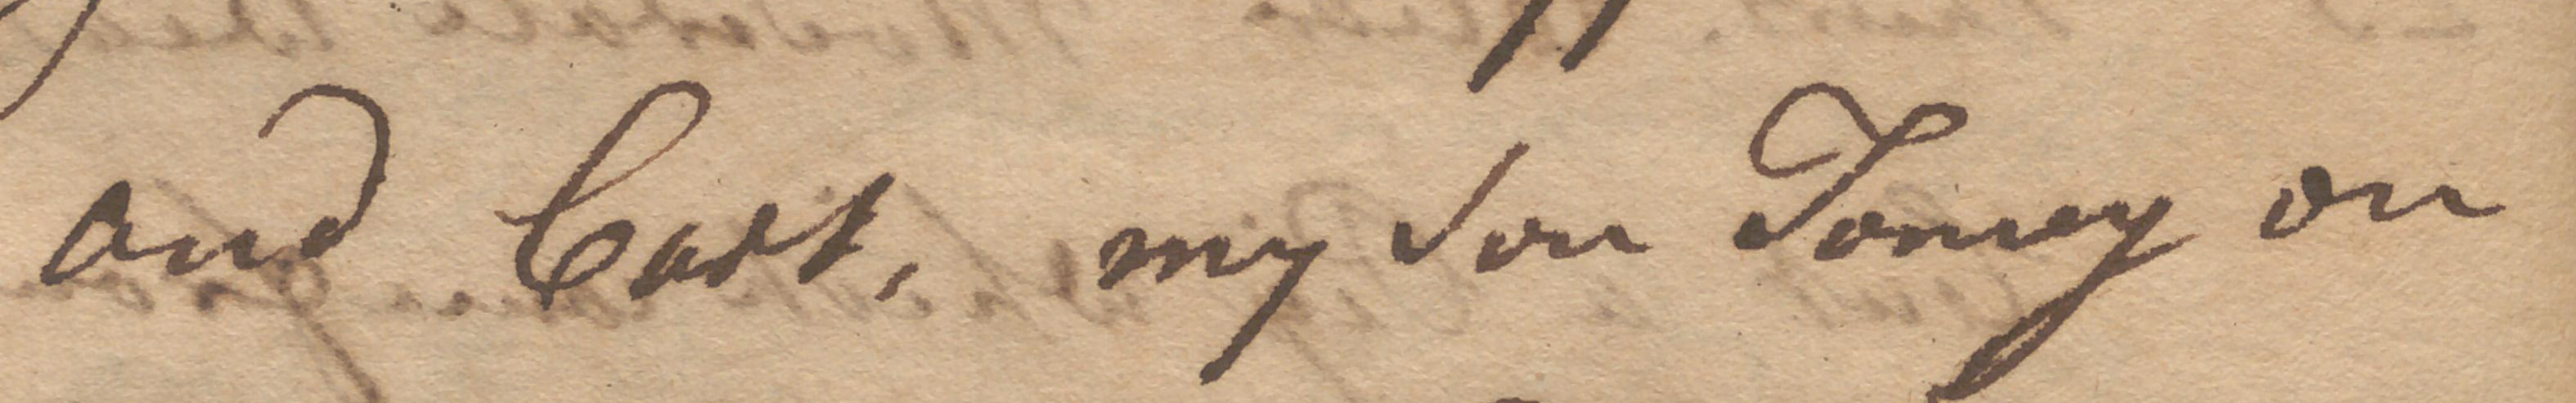and Cart, my Son Tomey on
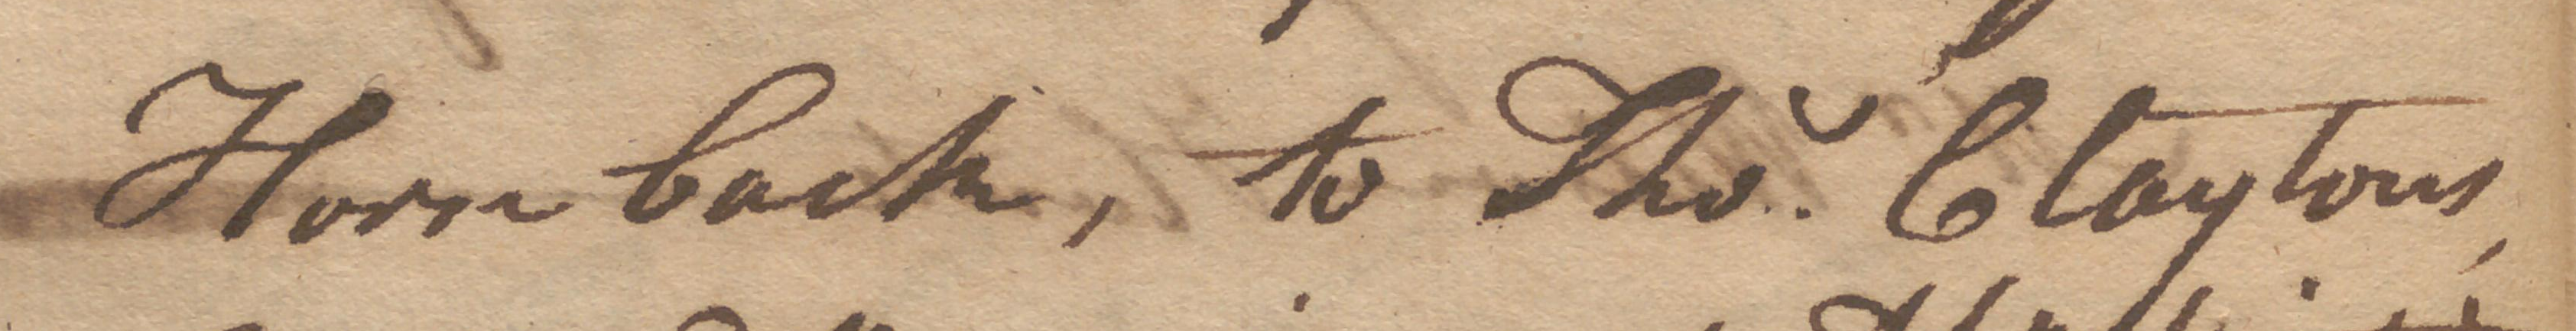Horseback, to Tho^s. Claytons,
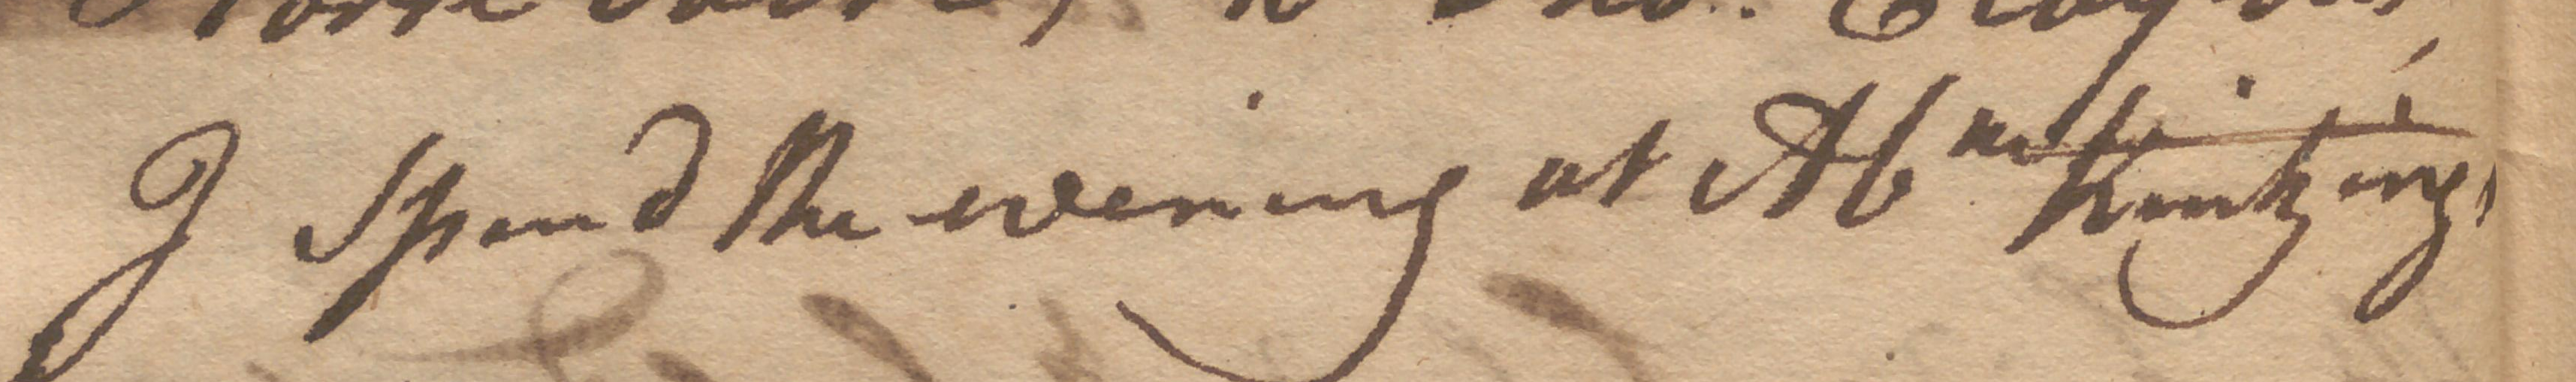I spend the evening at Ab^m Kintzings
